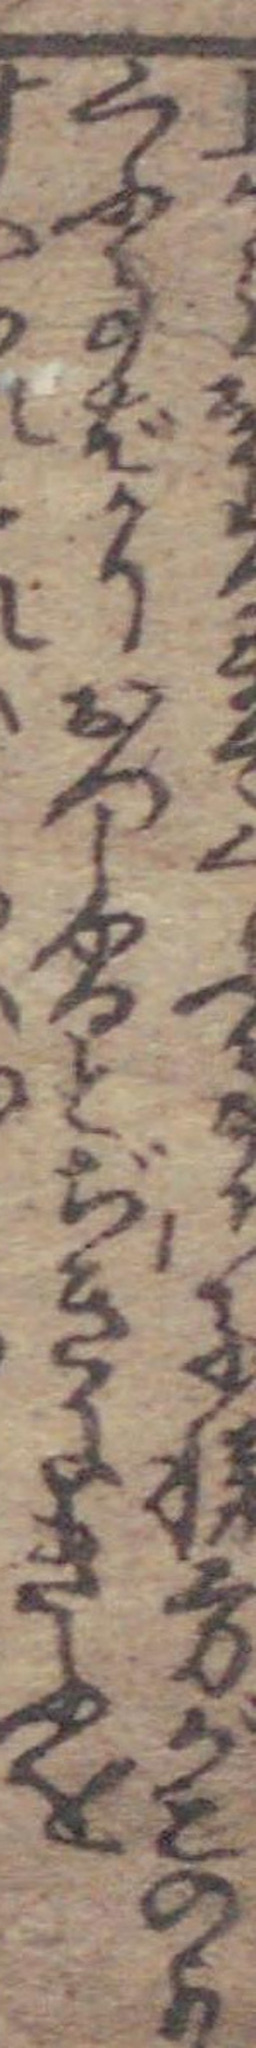くふ事ばかりおつしやるとぢきにきふを
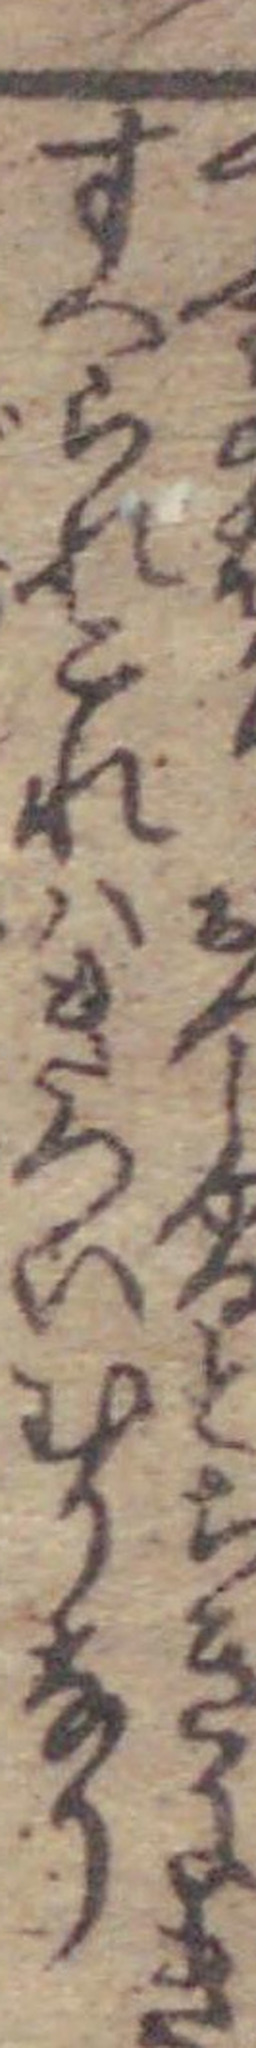すへられこれはきついむりなり
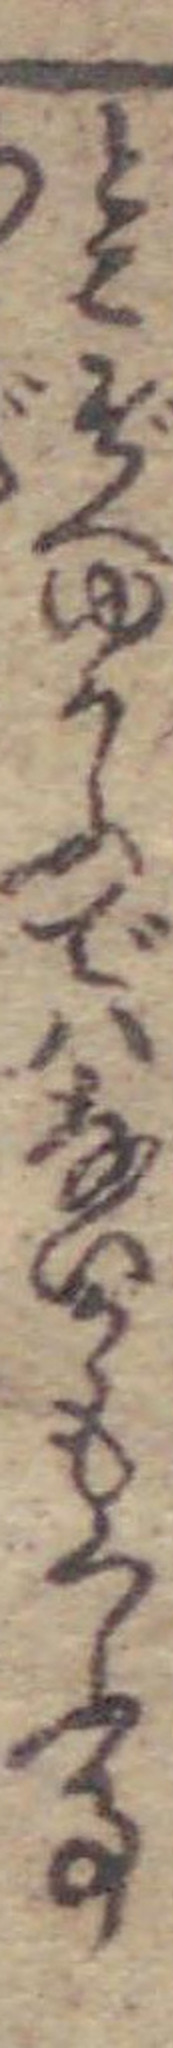とこぞへゆかふではないかもくふ事
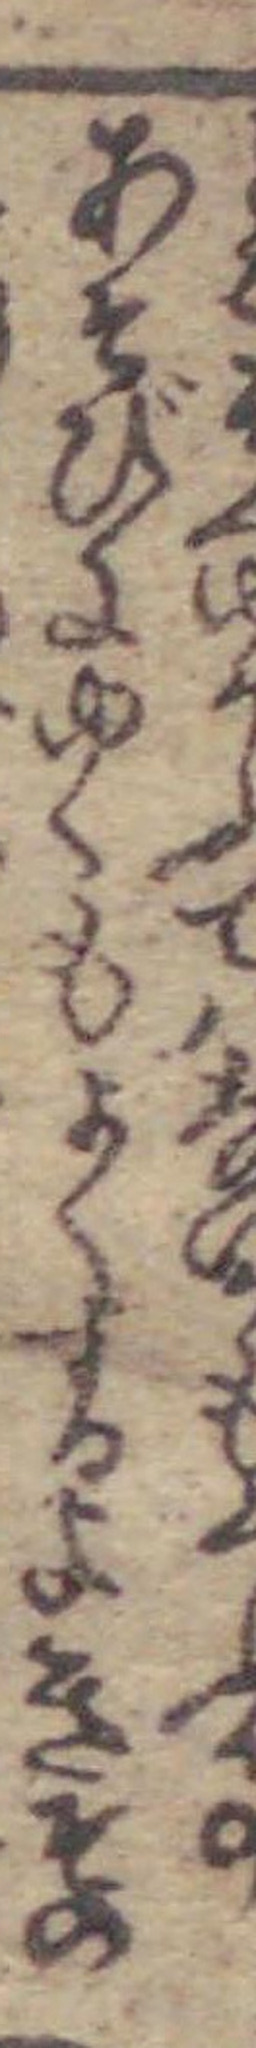あそびにゆくもよくするよきその
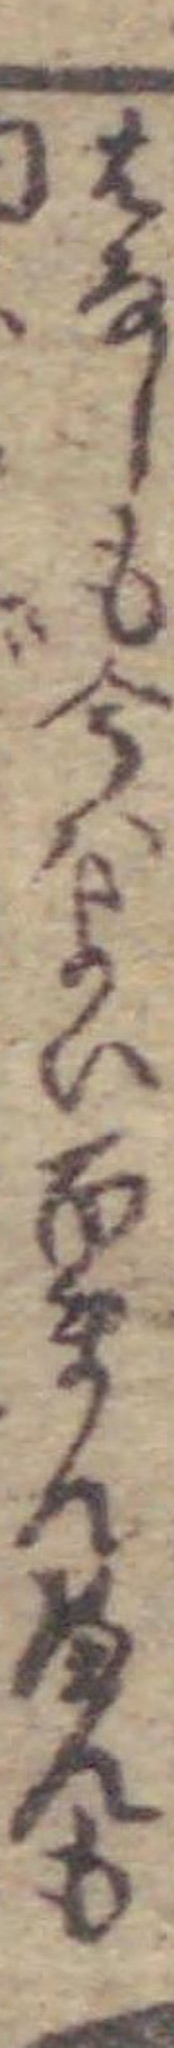はなしも今はよい百まんへんも
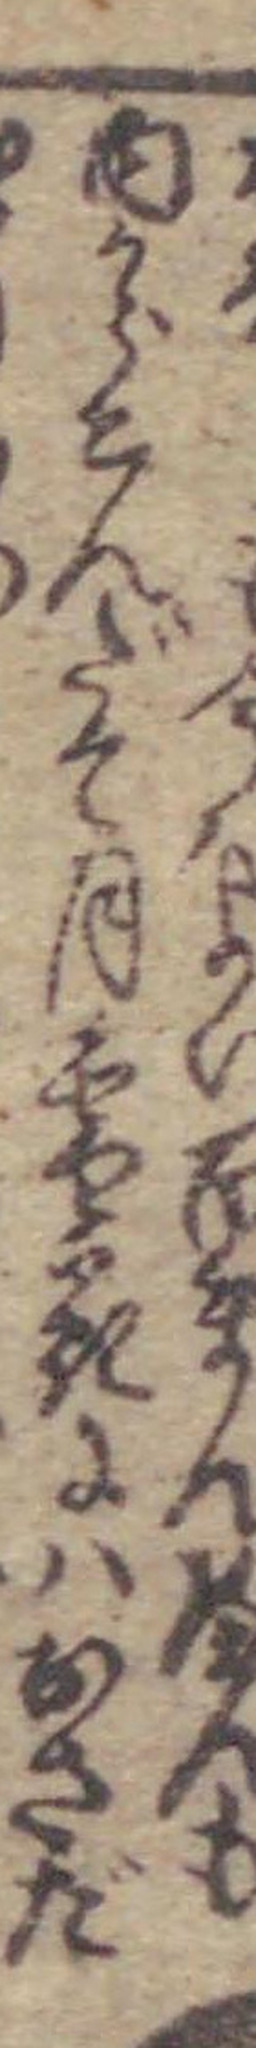内からこんだて月雪花にはおさだ
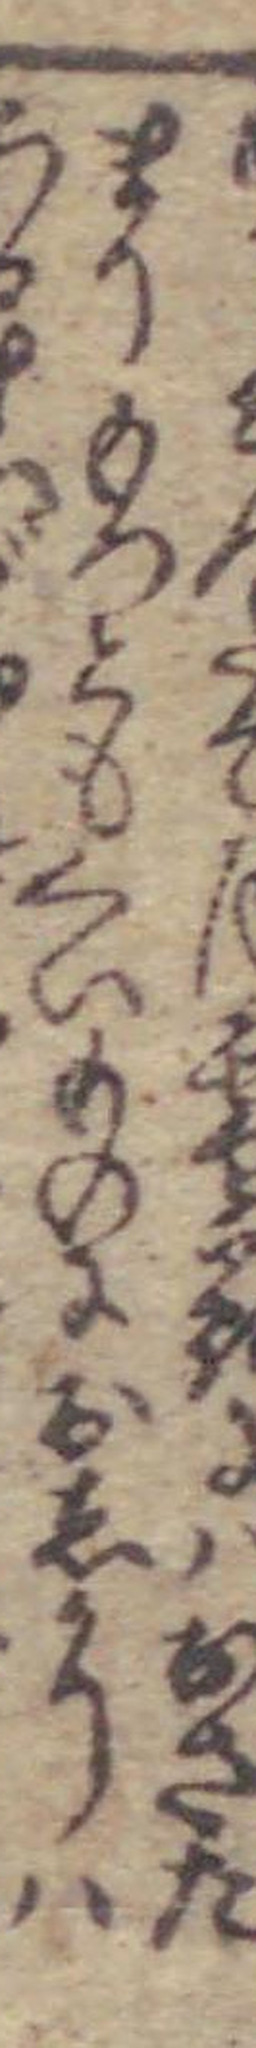まりもつともくいものにおしかりは
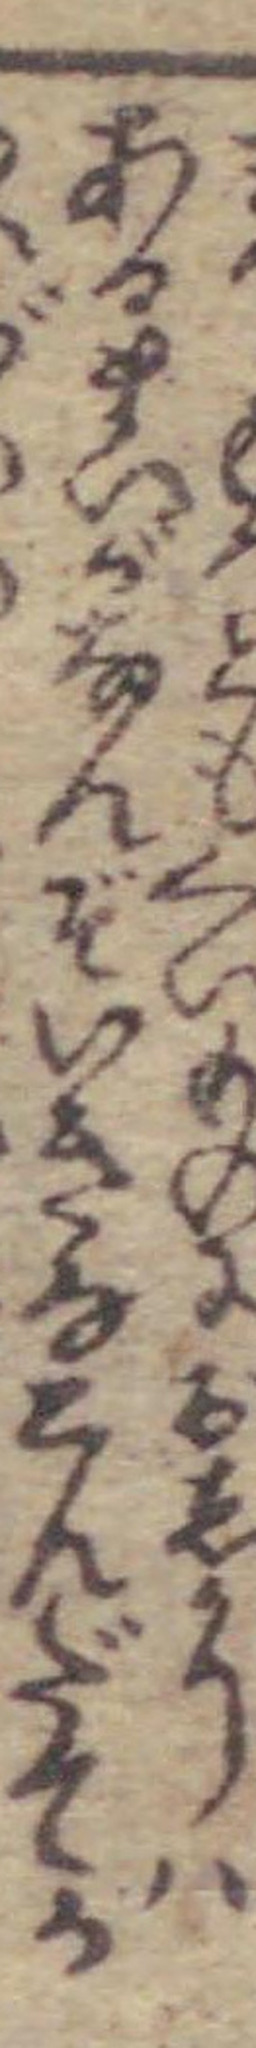あるまいがなんぞいきなこんだてが
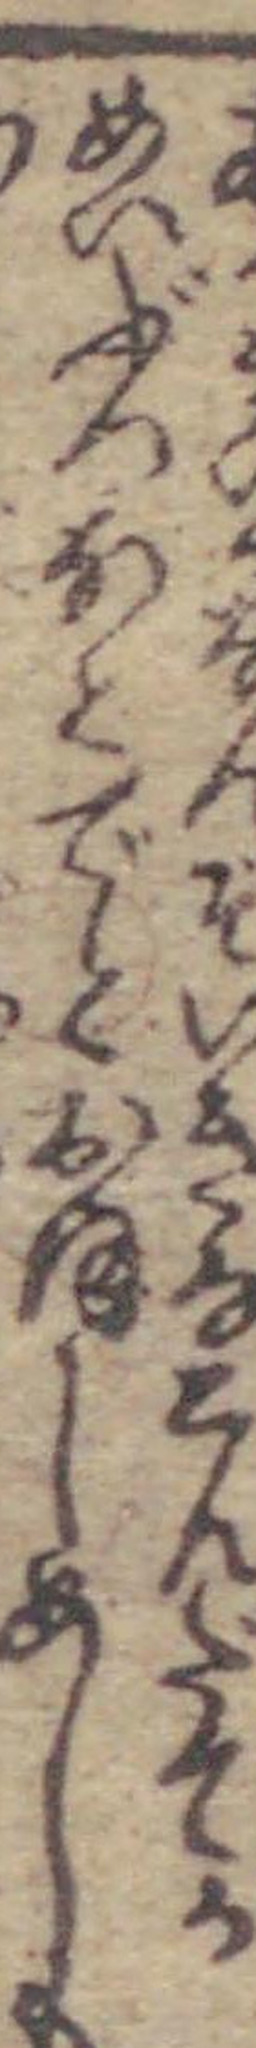めいぶつなとでとおぼしめしも
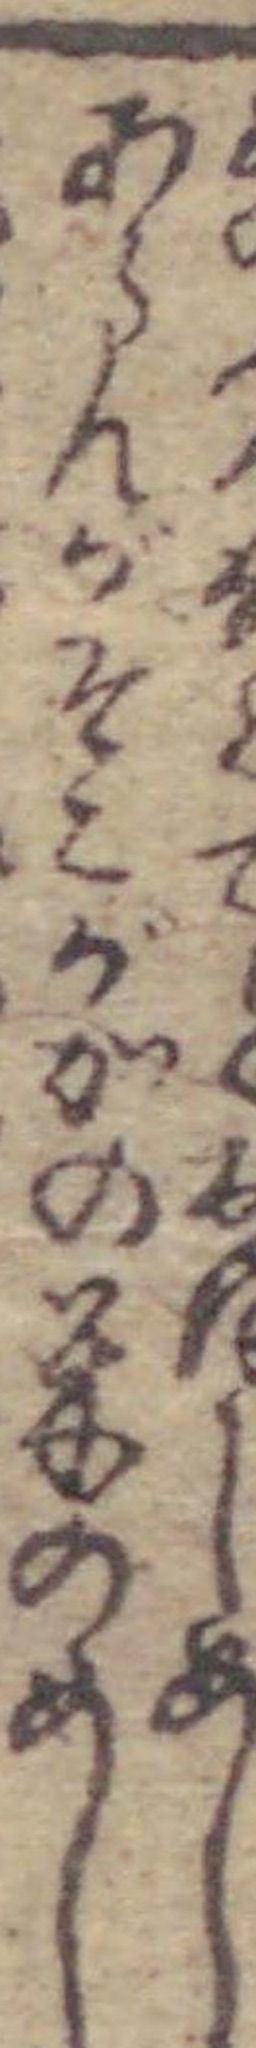あらんがそこがかの米のめし
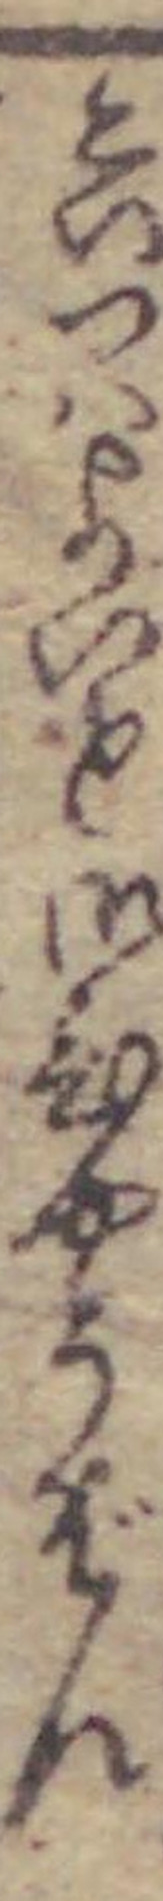こいつはよいと御ひやうばん
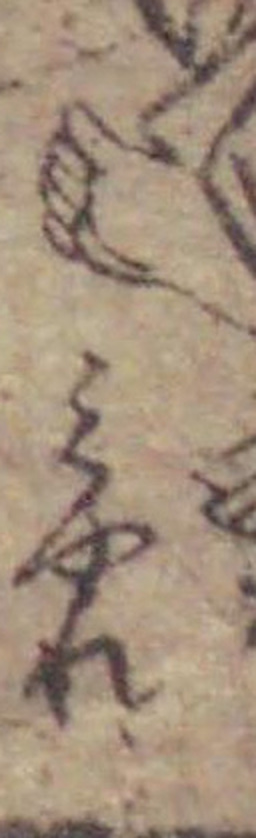みやれ
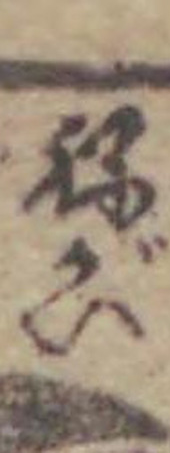ねがい
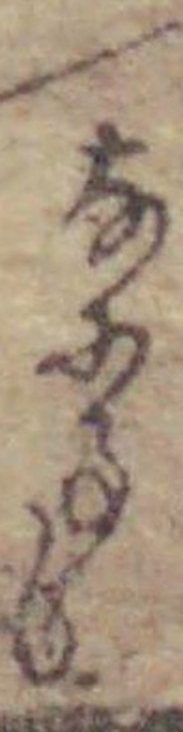なに事も
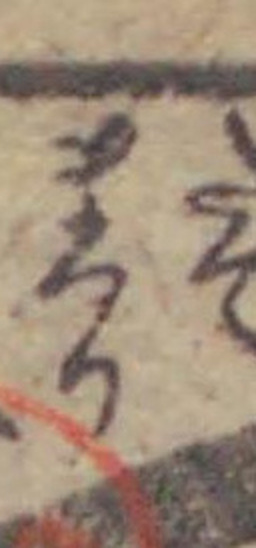まつり
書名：諸事米の飯 : 3巻
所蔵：国立国会図書館 National Diet Library, JAPAN
